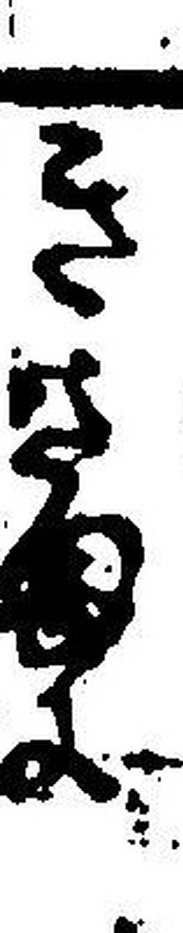きあまに
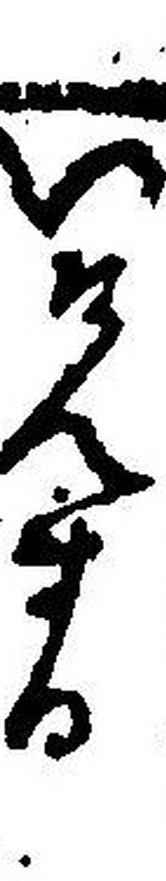いけんする
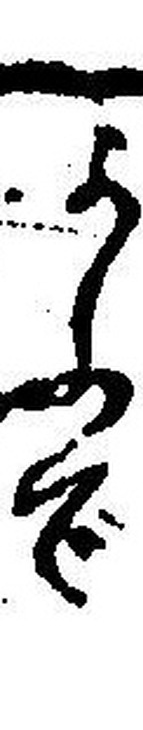よふで
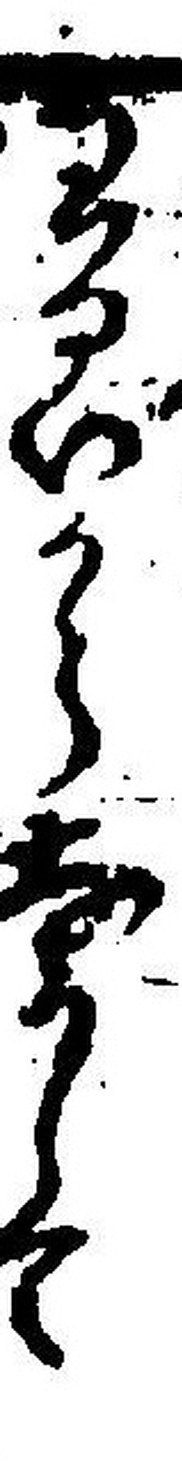わるいからなかして
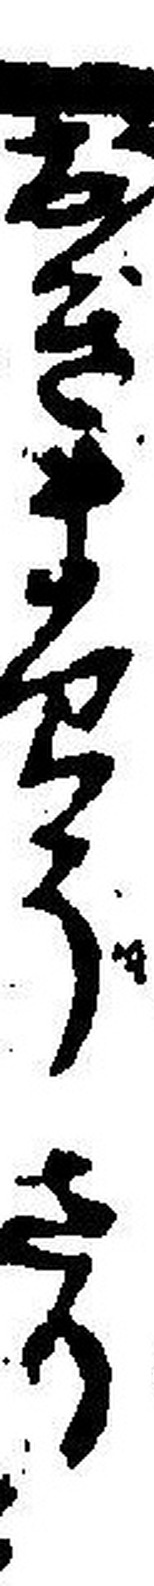おきませうさり
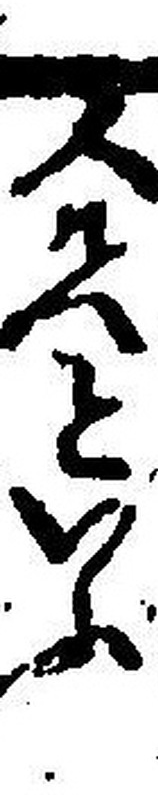人けんといふ
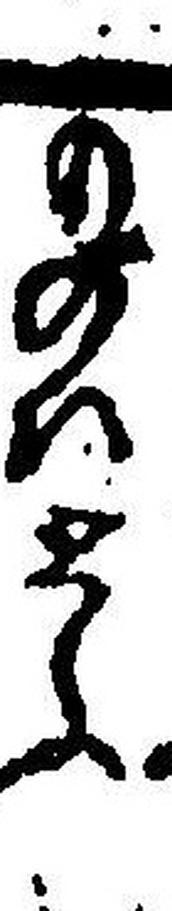ものはとふ
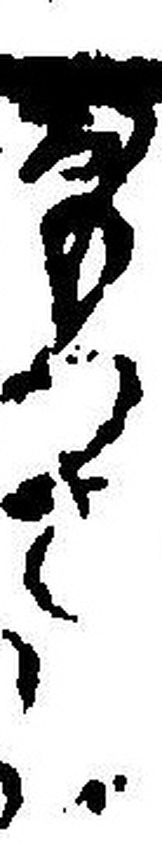おもつて
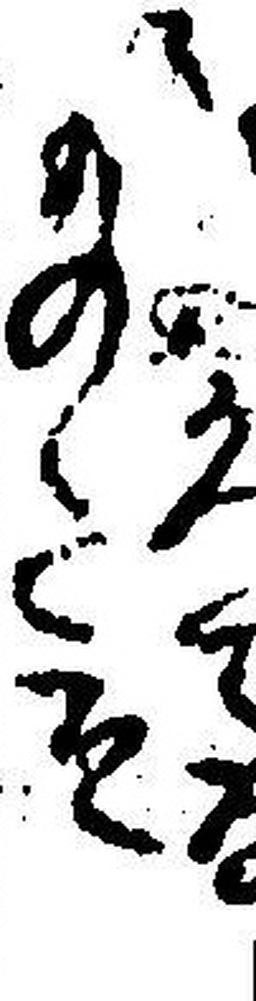ものたそ

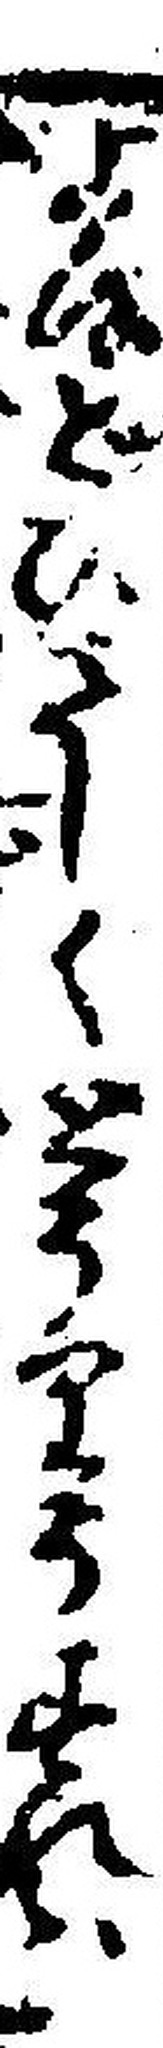よほどひさしくとうりうすれは
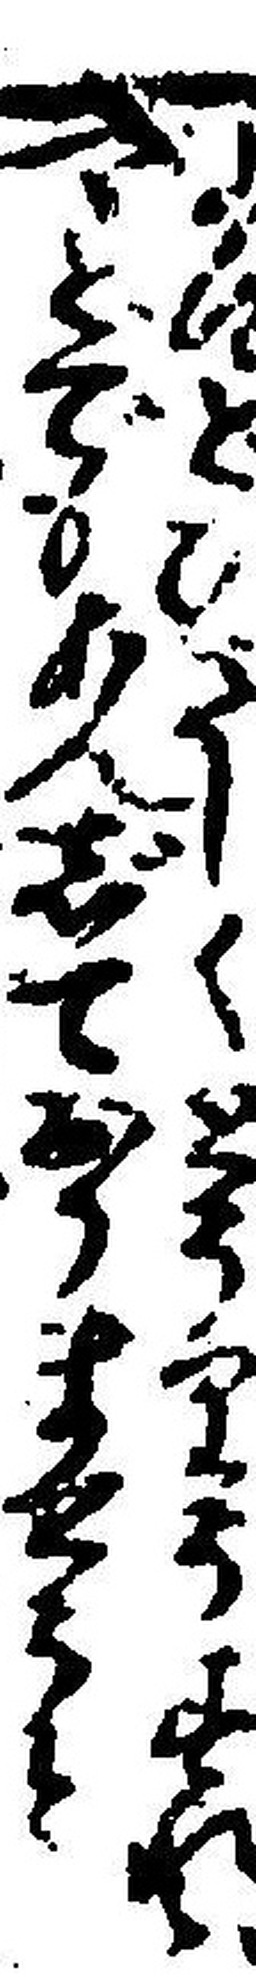やとてもあんじておりませうと
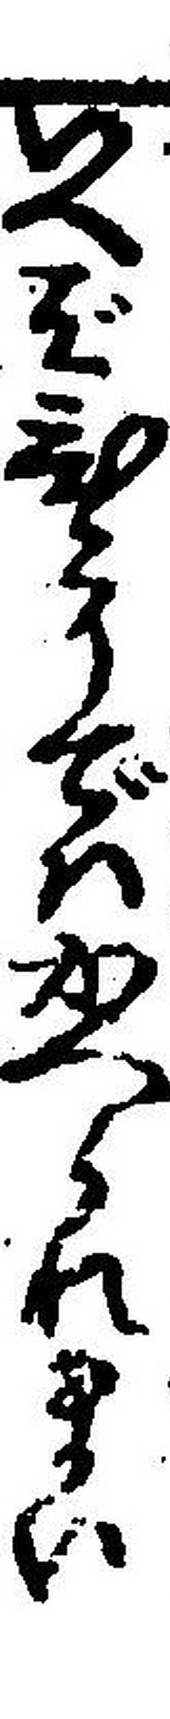いへばひとりではかへられまい
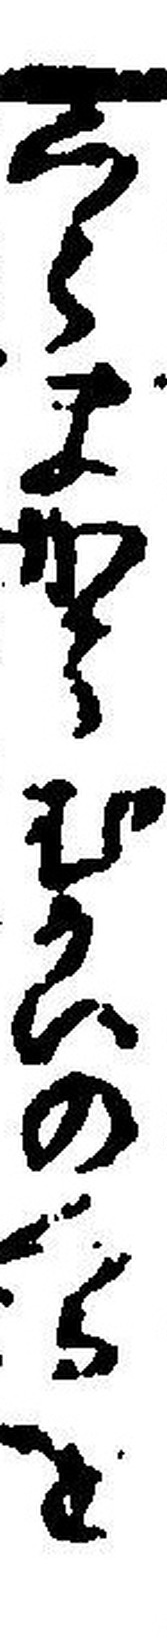くらまからむかいのくるを
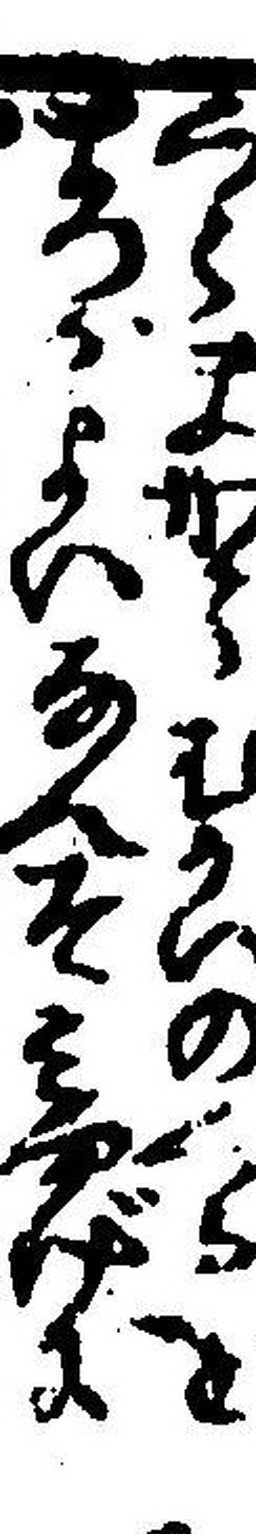まつがよいなんそみやげに
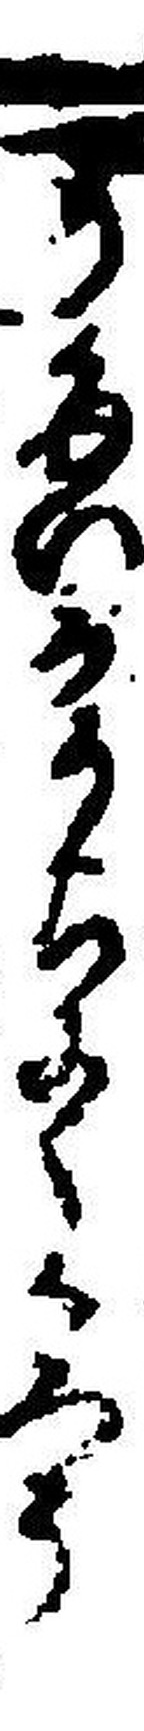やりたいかうちにくかろう
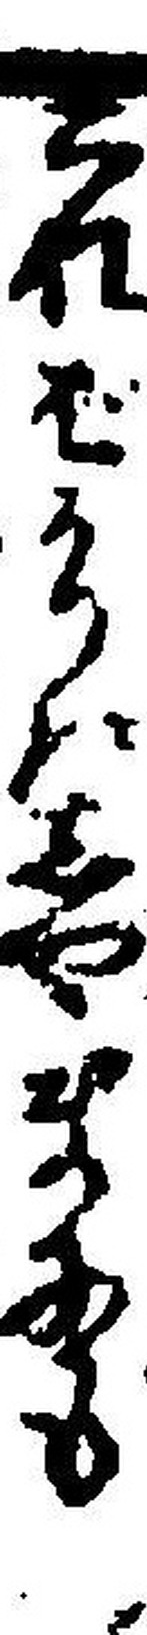こればかりはしやまにも
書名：牡丹餅棚有 / 市場通笑作
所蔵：東京大学総合図書館 General Library in the University of Tokyo, JAPAN
